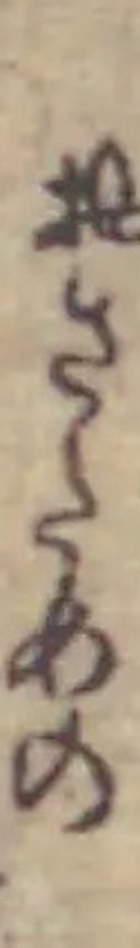おさための
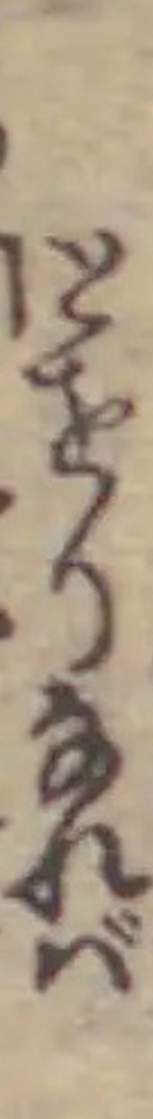とをりなれば
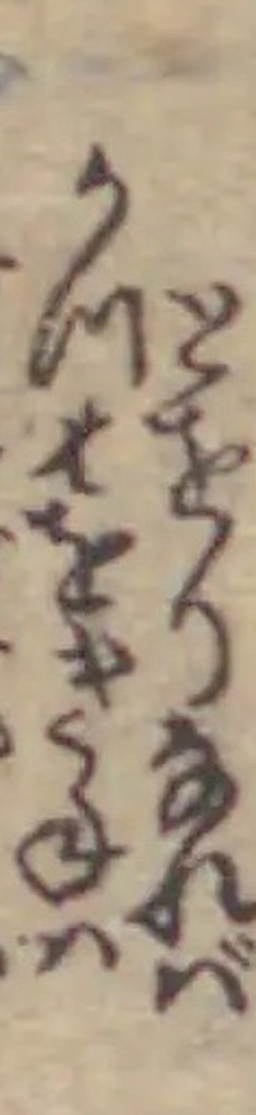かつはをきねは
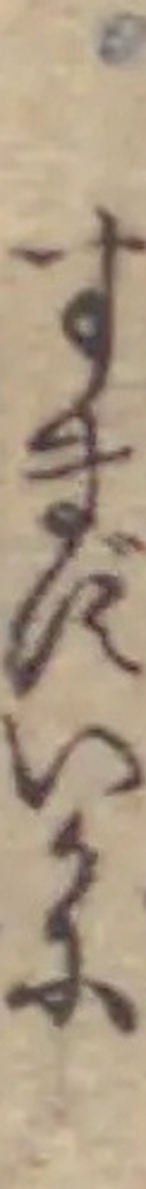すまずいかに
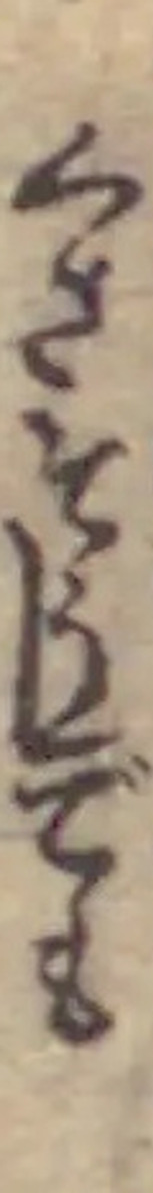くさそうしでも
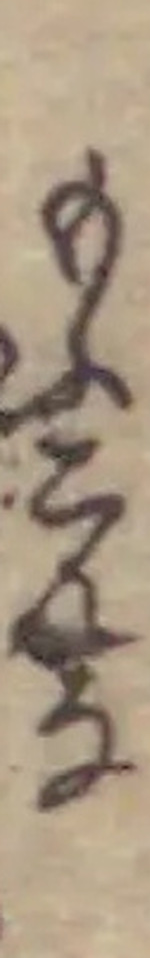もふこんな
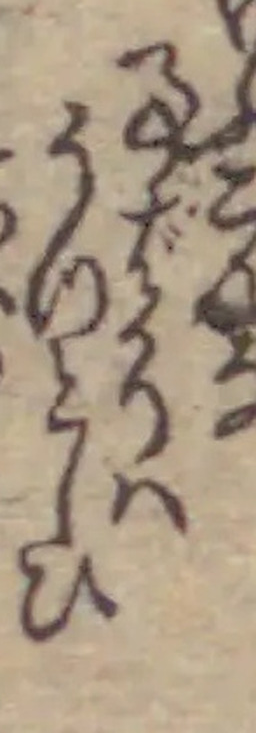うつとしひ
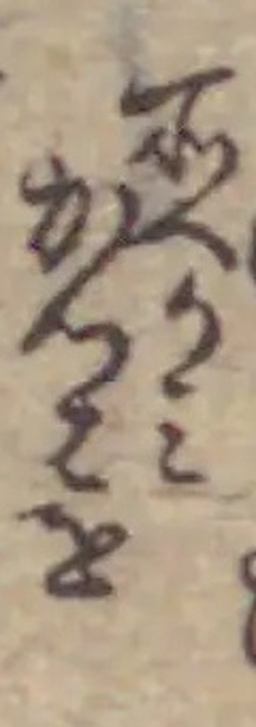かつはを
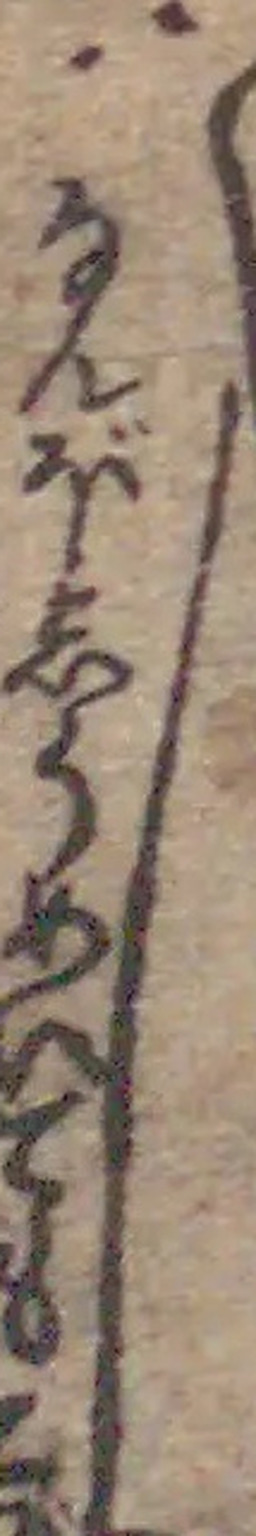なんぼしうめいてもこの
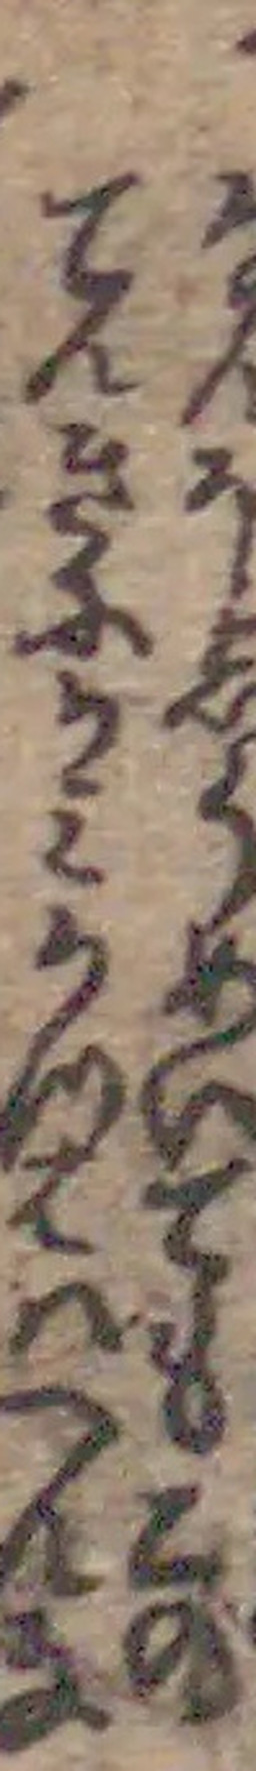てんきにかみかつははへんな
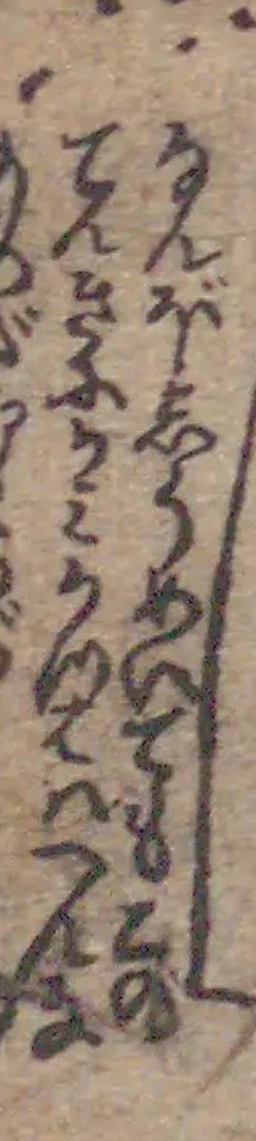てんきにかみかつははへんな
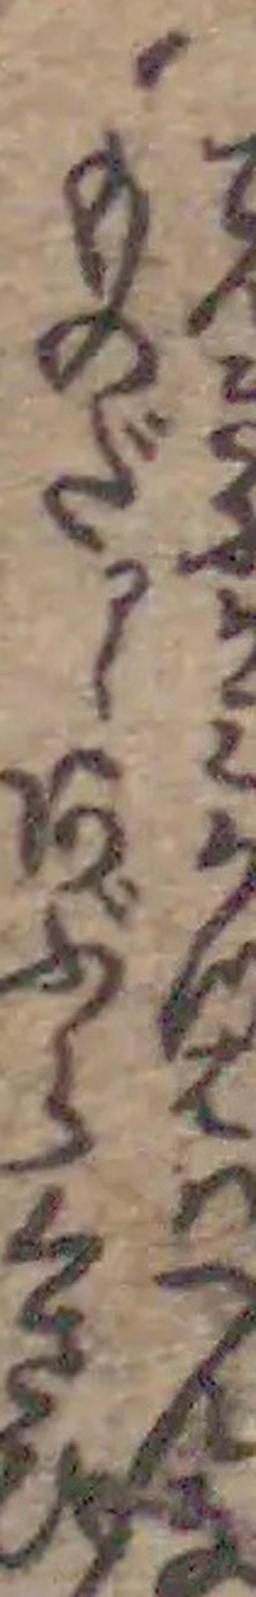ものたアあぶらくさひ〳〵

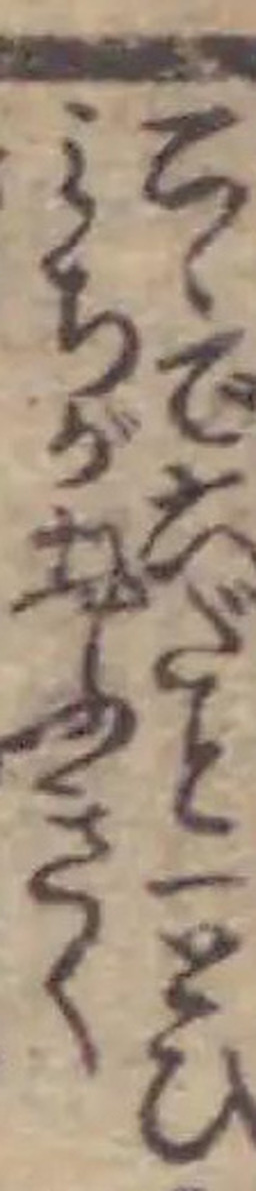みちがおふきく
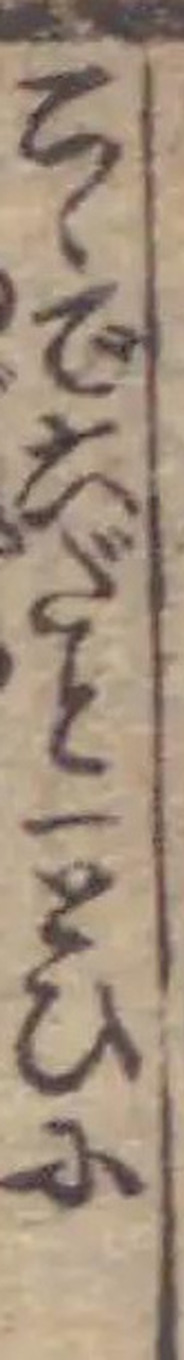こゝで六だと一とひに
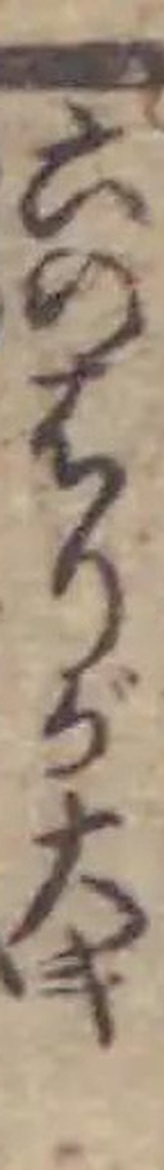六のはりが大き
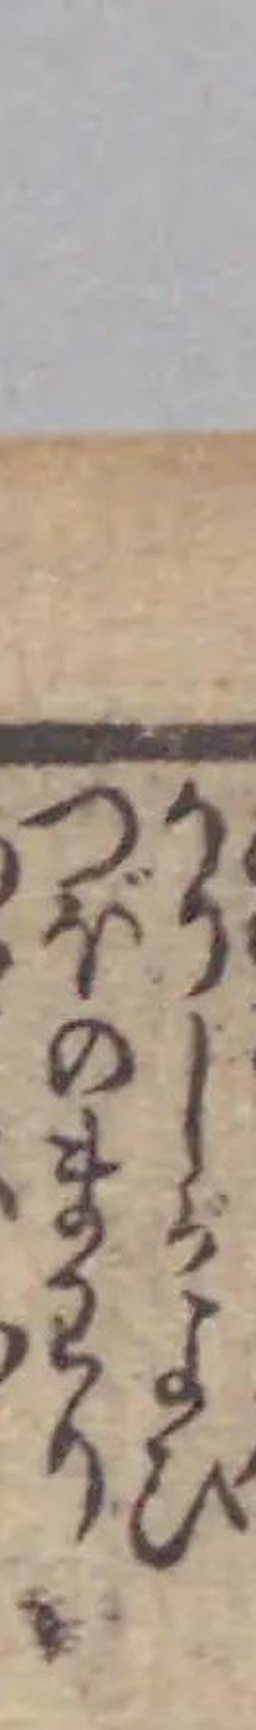つぼのまわり
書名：道笑双六
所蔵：国立国会図書館 National Diet Library, JAPAN
